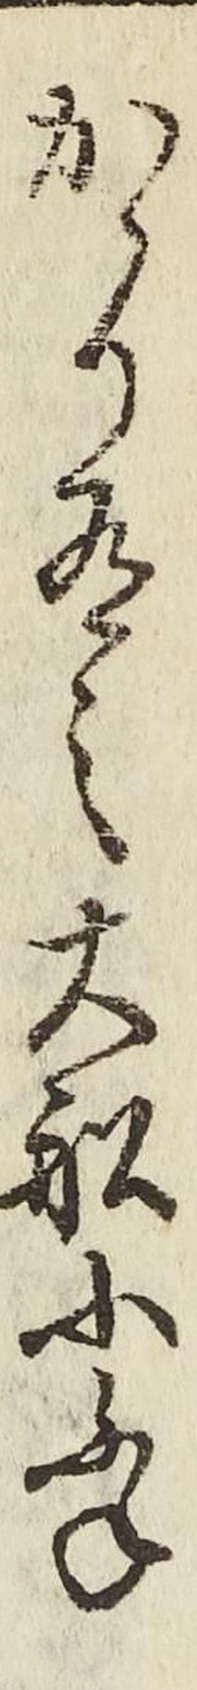かゝり有之大船小ふね
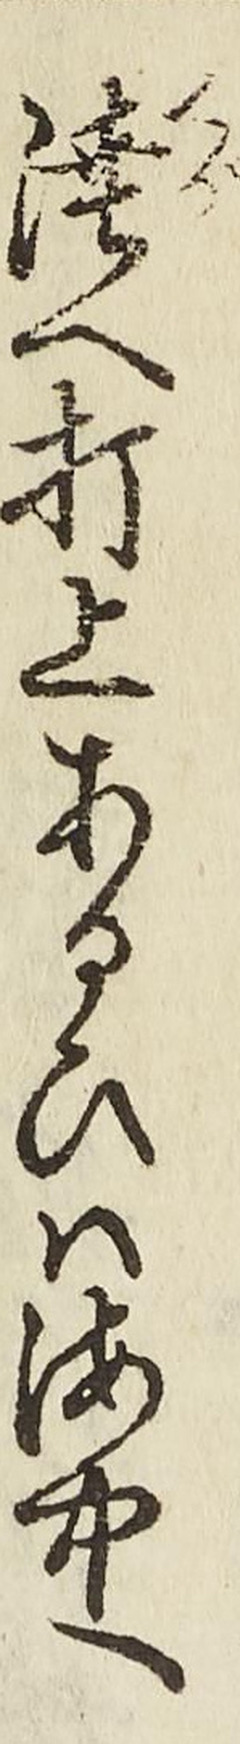陸へ打上あるひは海中へ
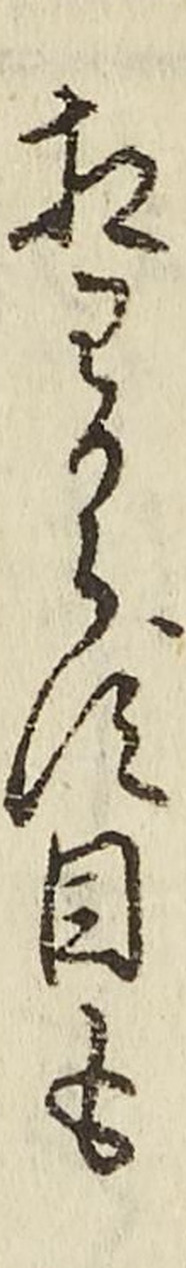相わからず目も
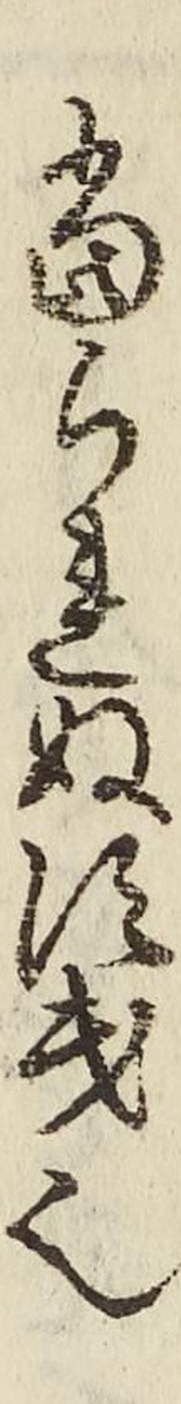当られぬ次第也
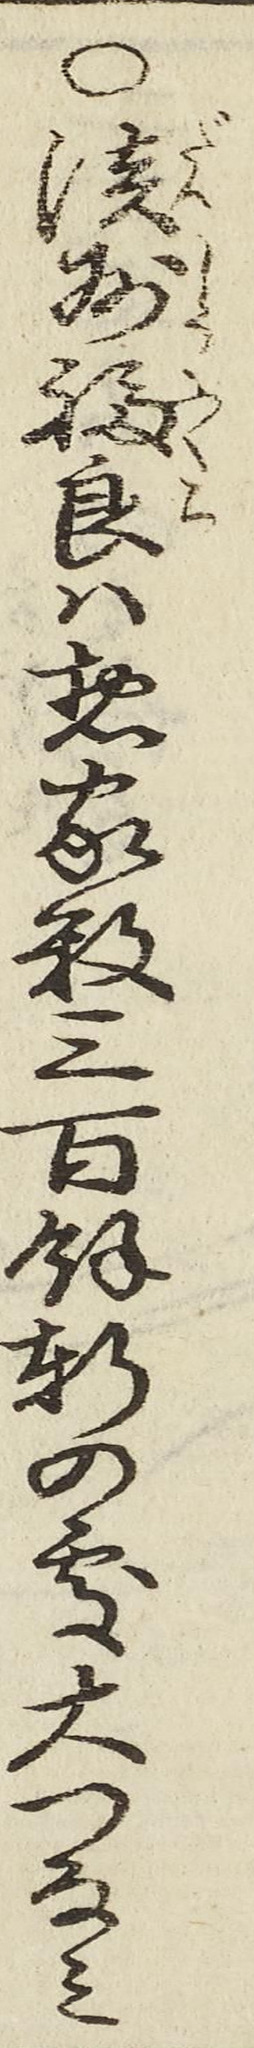○淡州福良は惣家数三百軒の処大つなみ
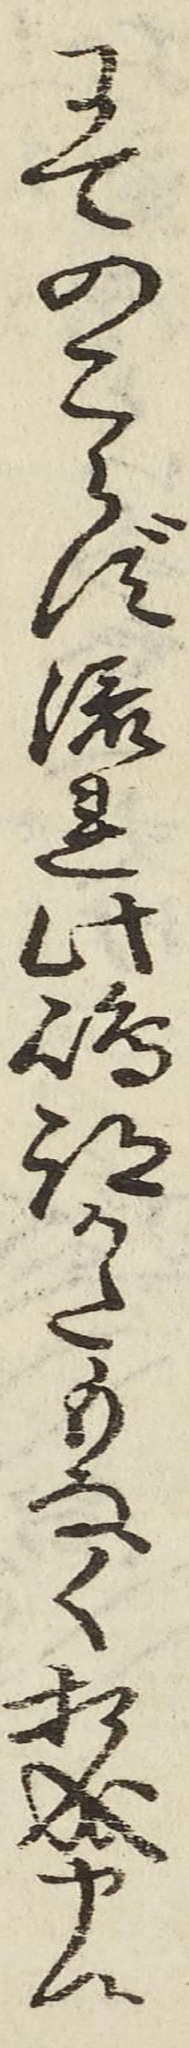にてのこらず流れ此嶋跡かたもなく相成申候
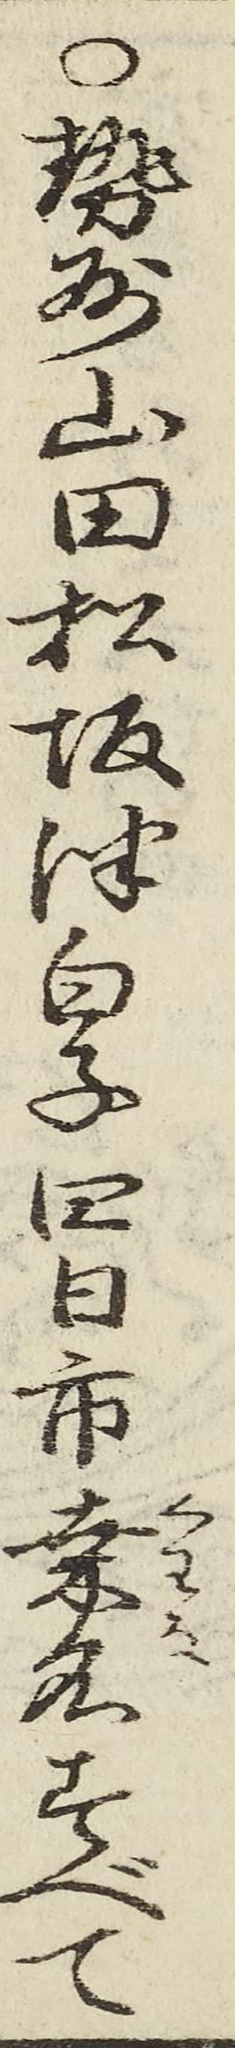○勢州山田松坂津白子四日市桑名すべて
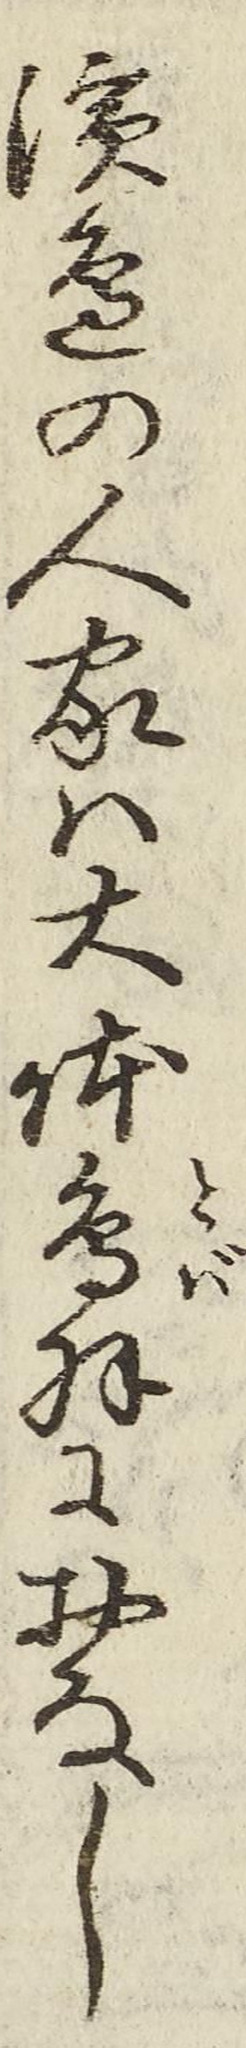浜辺の人家は大体鳥羽におなし
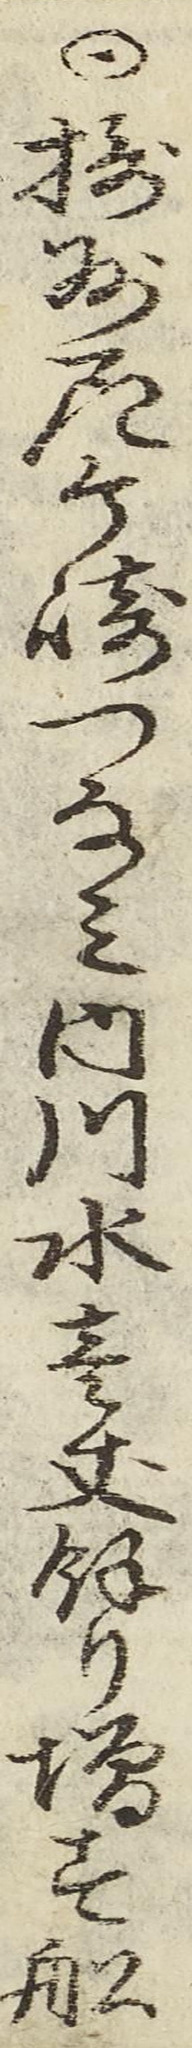○摂州尼ケ崎つなみ内川水壱丈余り増す船
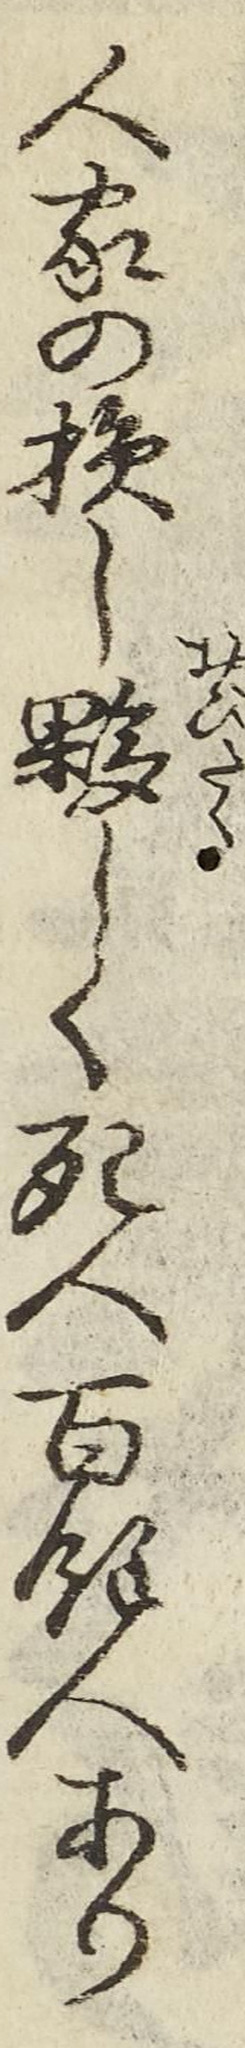人家の損し夥しく死人百余人あり

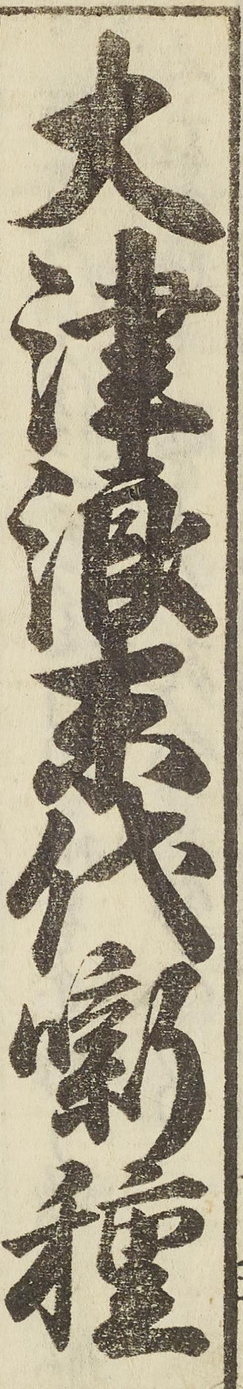大津浪末代噺種
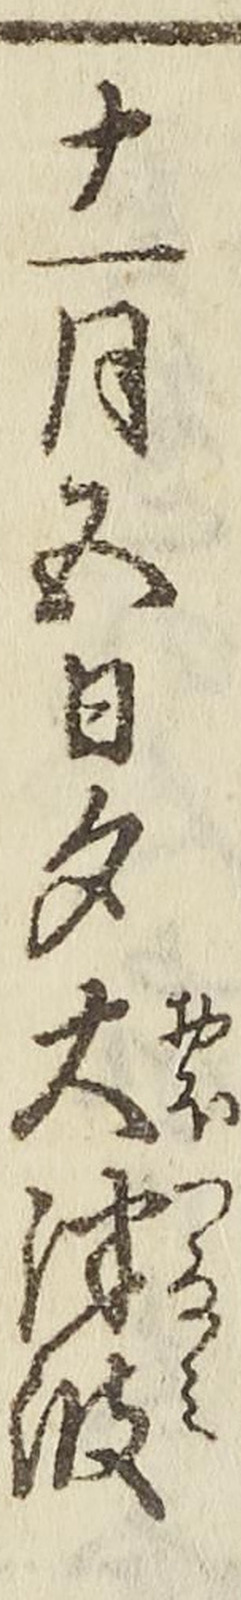十一月五日夕大津浪
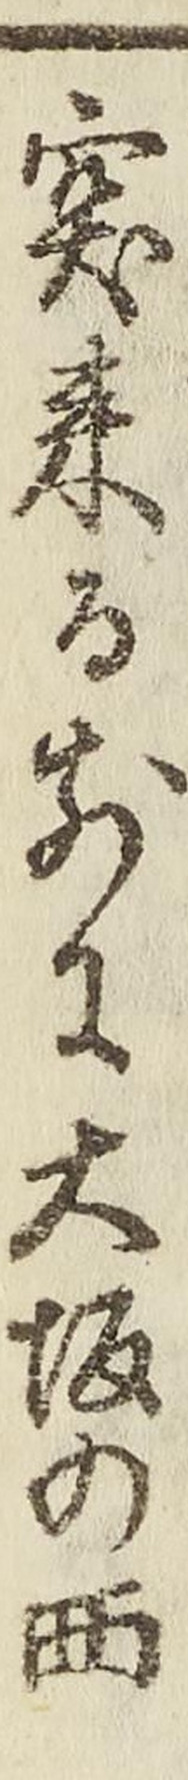突来る前に大坂の西
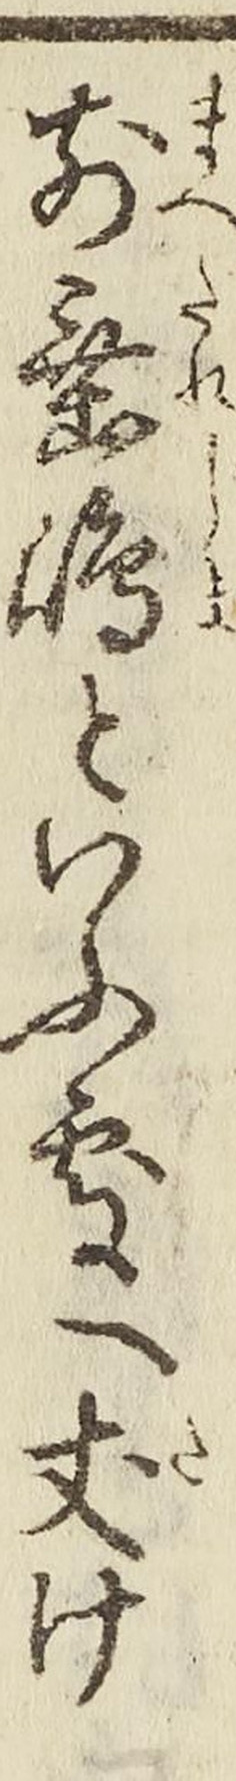前垂嶋といふ処へ丈け
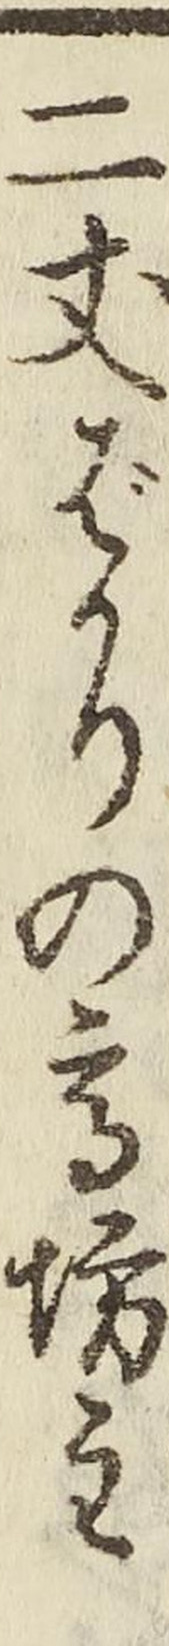二丈ばかりの高坊主
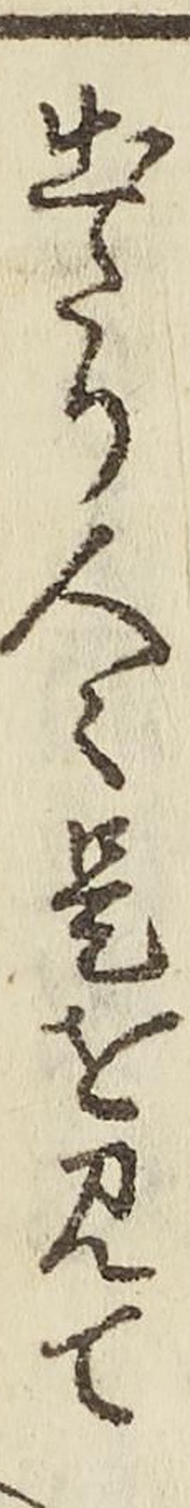出たり人々是を見て
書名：地震津浪末代噺の種　全
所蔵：東京大学地震研究所図書室 Earthquake Research Institute Library, The University of Tokyo, JAPAN
